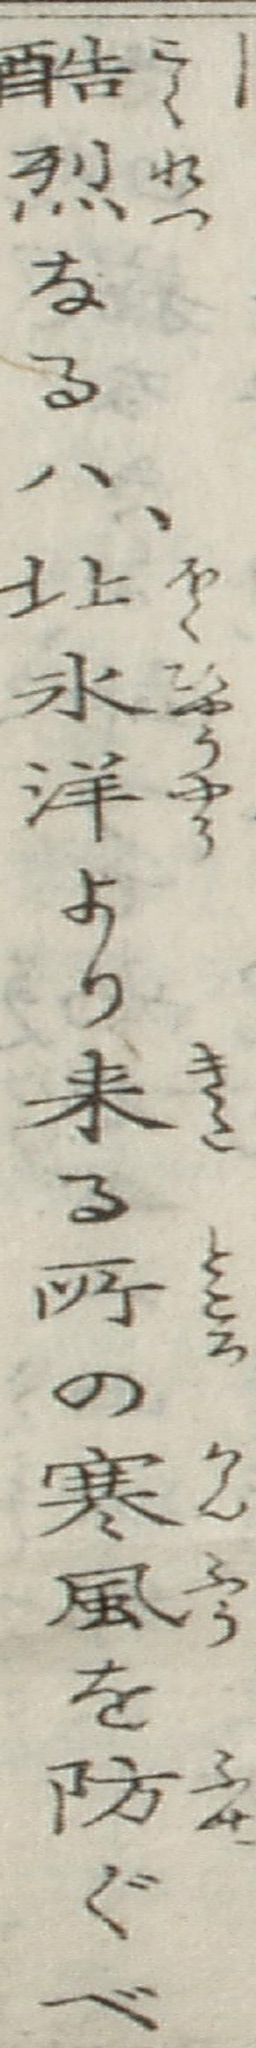酷烈なるは、北氷洋より来る所の寒風を防ぐべ

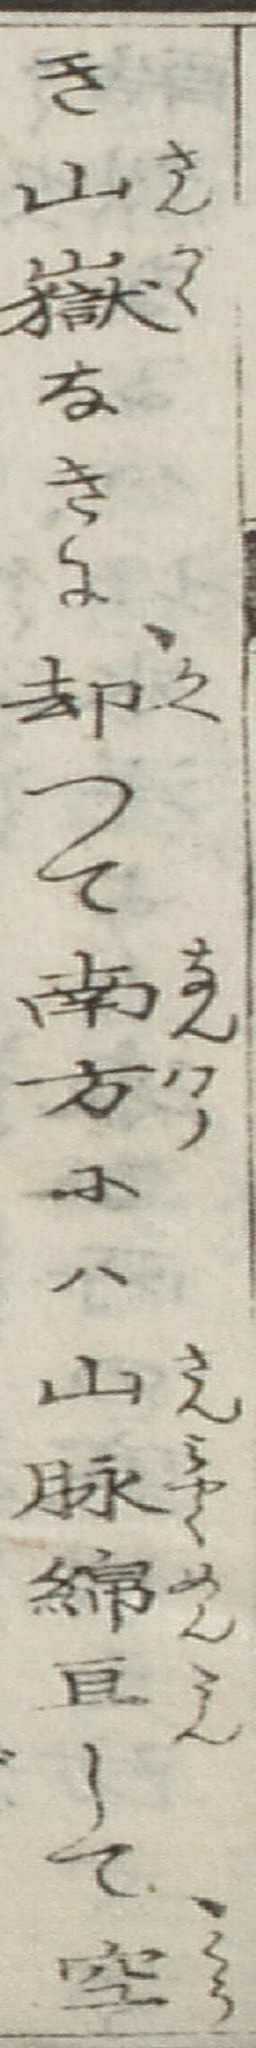き山嶽なきに、却つて南方には山脈綿亘して、空
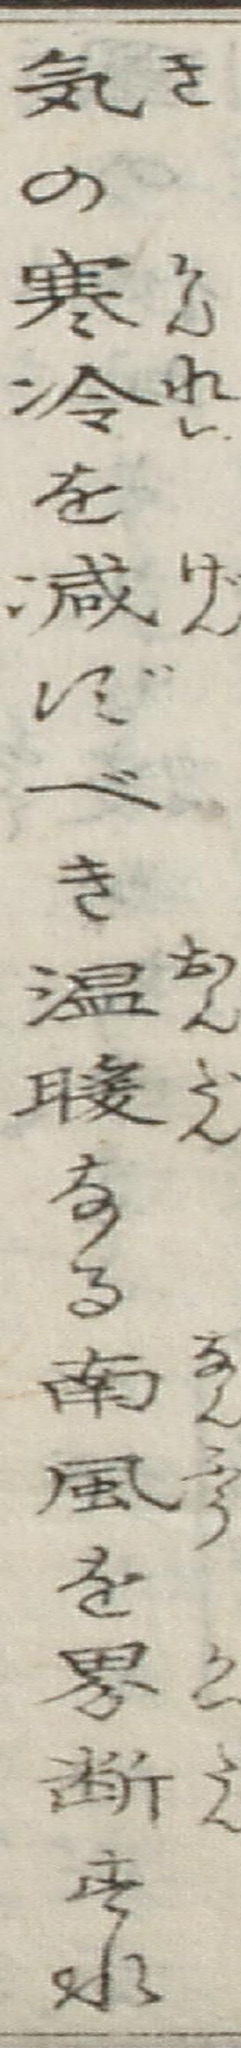気の寒冷を減ずべき温暖なる南風を界断すれ
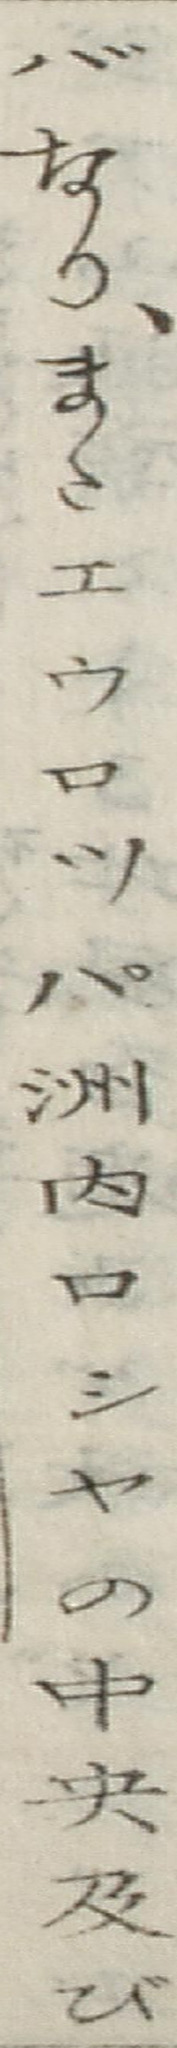ばなり、またエウロツパ洲内ロシヤの中央及び
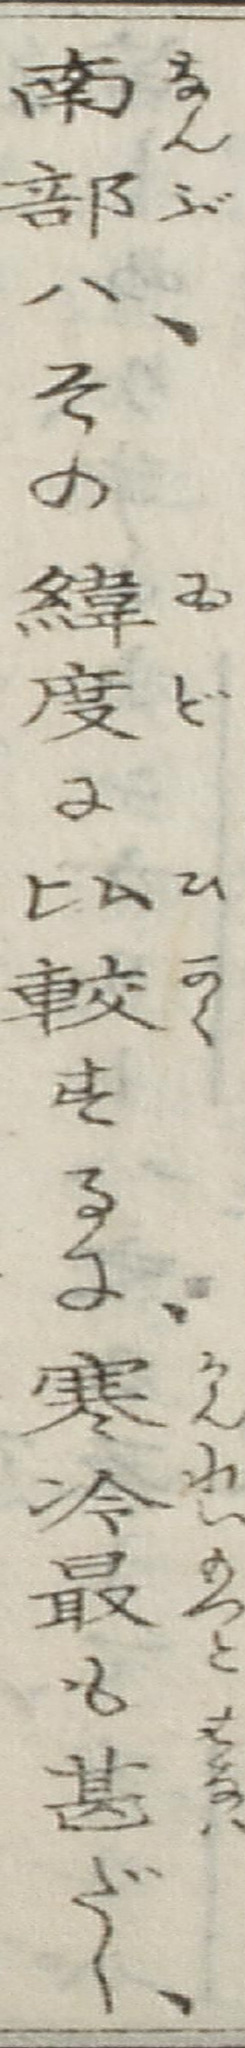南部は、その緯度に比較するに、寒冷最も甚だし、
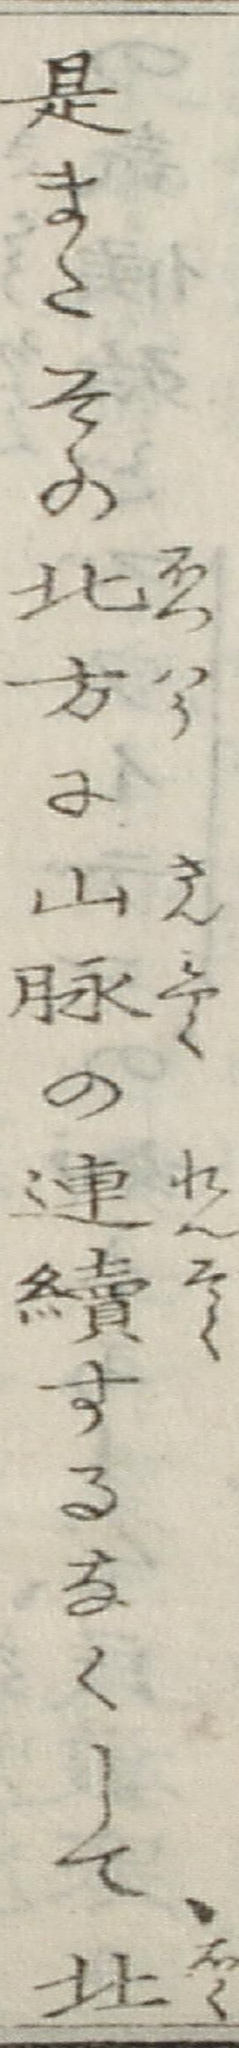是またその北方に山脈の連続するなくして、北
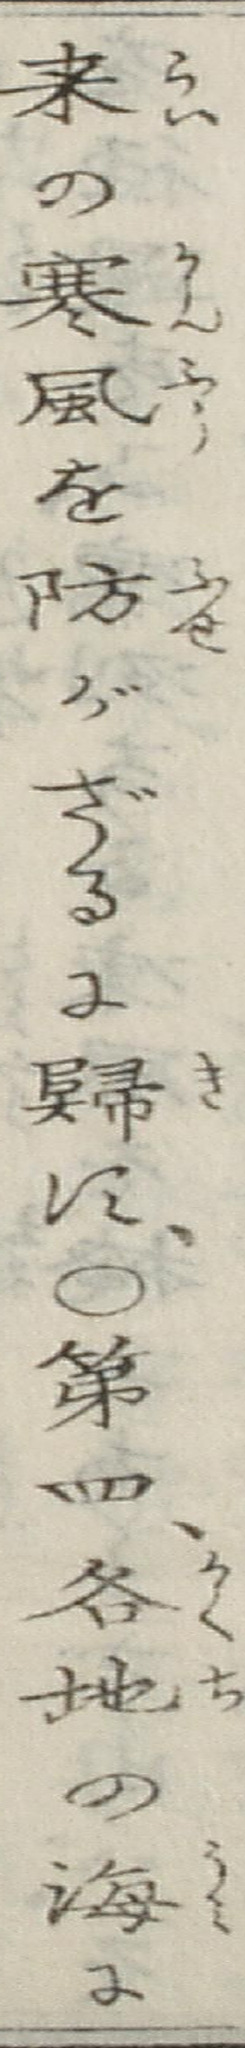来の寒風を防がざるに帰す、○第四、各地の海に
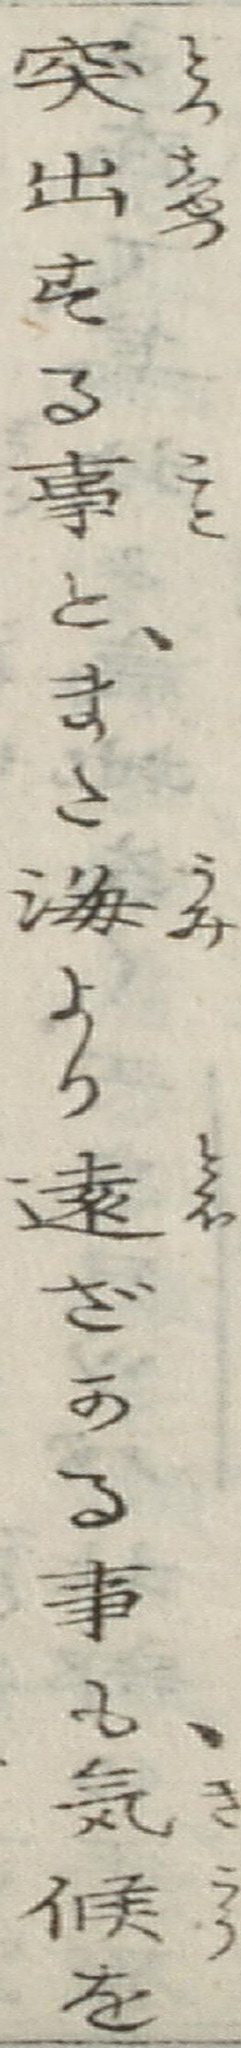突出する事と、また海より遠ざかる事も、気候を
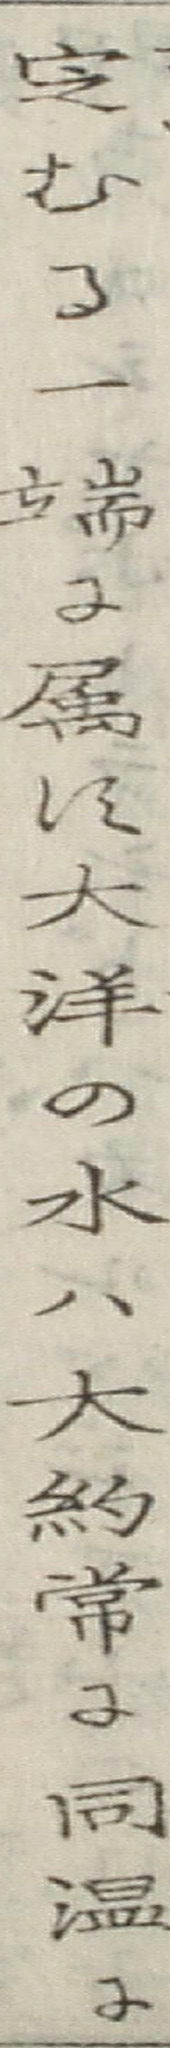定むる一端に属す、大洋の水は大約常に同温に
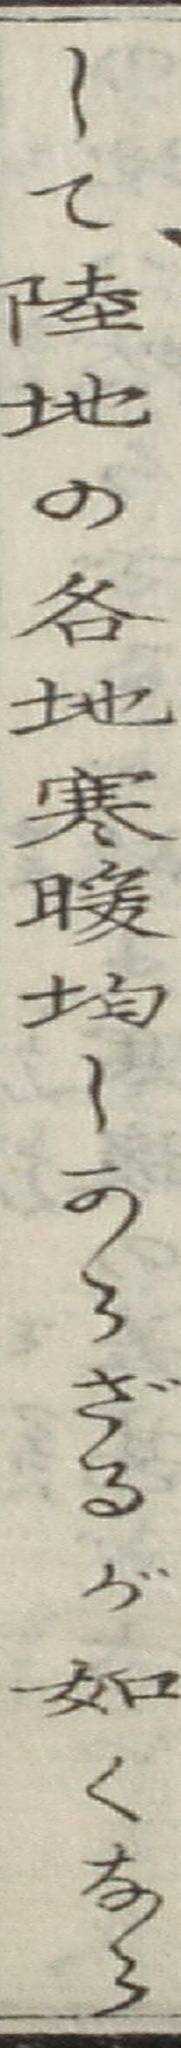して、陸地の各地寒暖均しからざるが如くなら
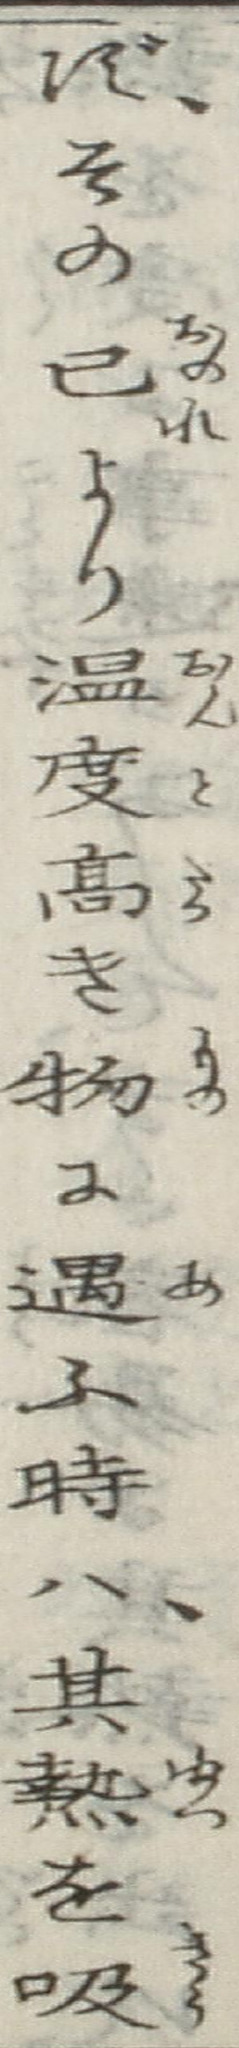ず、その己より温度高き物に遇ふ時は、其熱を吸
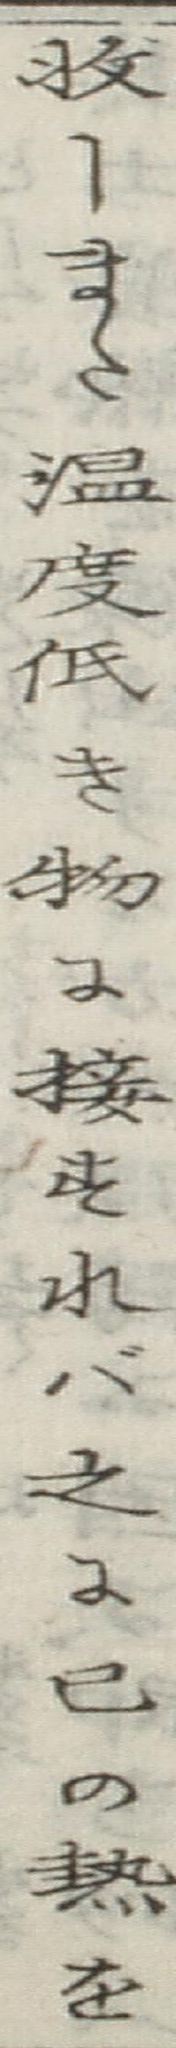収しまた温度低き物に接すれば之に己の熱を
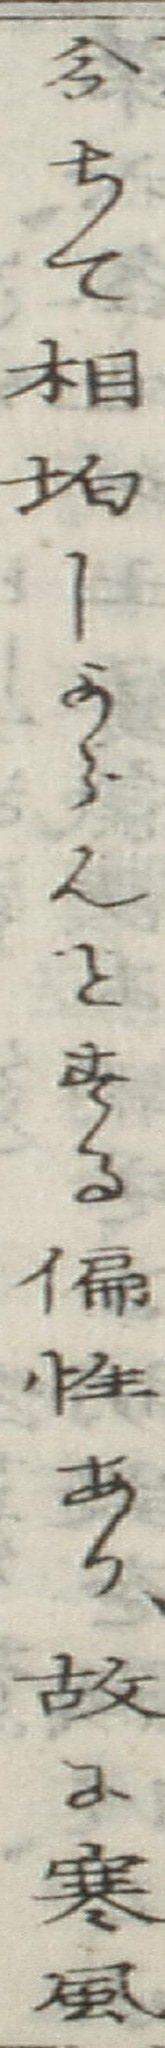分ちて相均しからんとする偏性あり、故に寒風
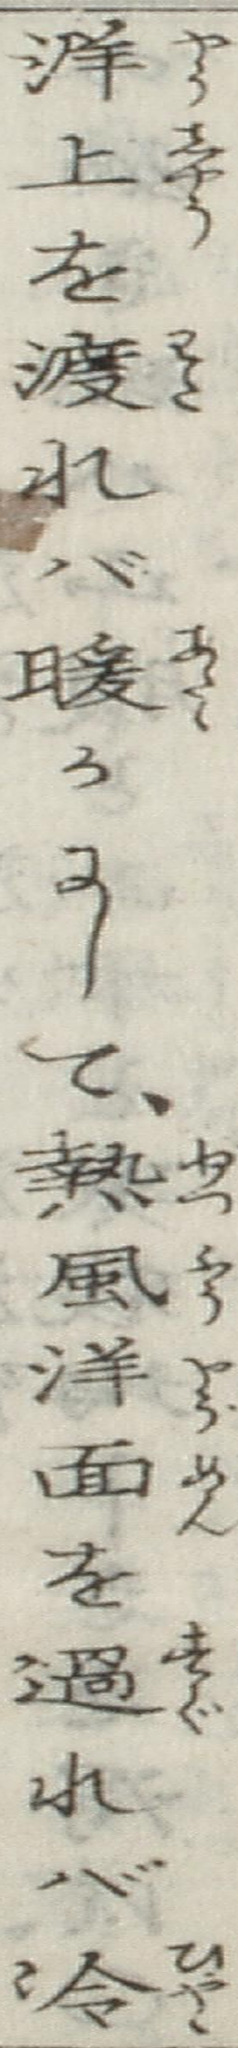洋上を渡れば暖かにして、熱風洋面を過れば冷
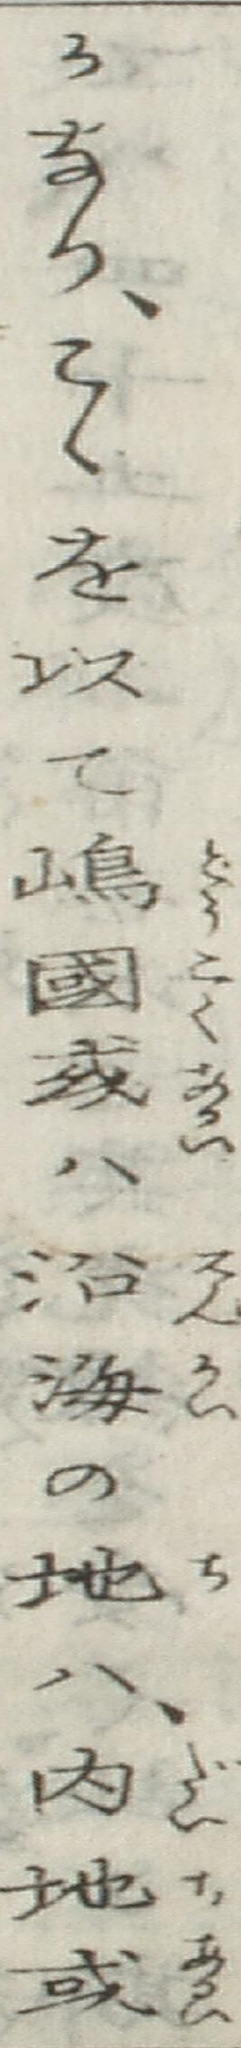かなり、こゝを以て嶋国或は沿海の地は、内地或
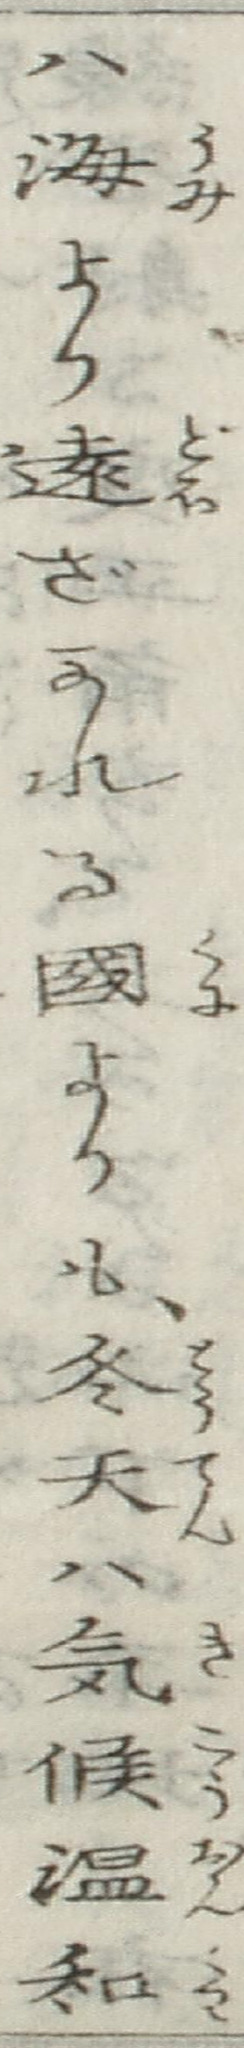は海より遠ざかれる国よりも、冬天は気候温和
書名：訓蒙　天然地理學　下
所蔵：東京大学地震研究所図書室 Earthquake Research Institute Library, The University of Tokyo, JAPAN
